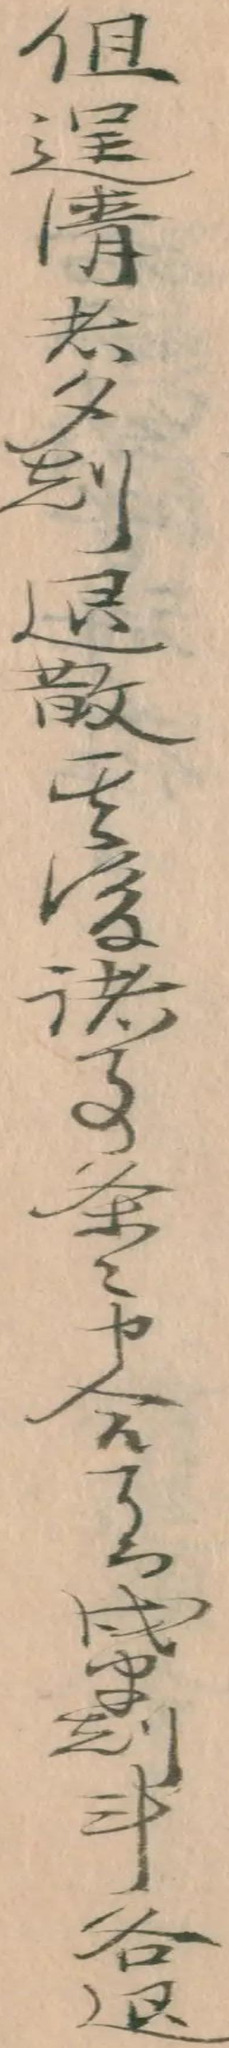但逞清者夕刻退散其後諸事条々申合了而戌半刻斗各退
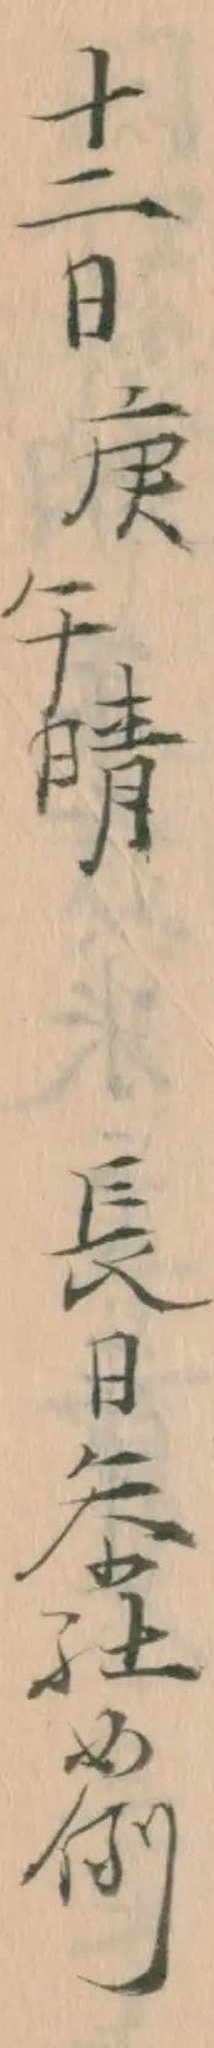十二日庚午晴長日参社如例
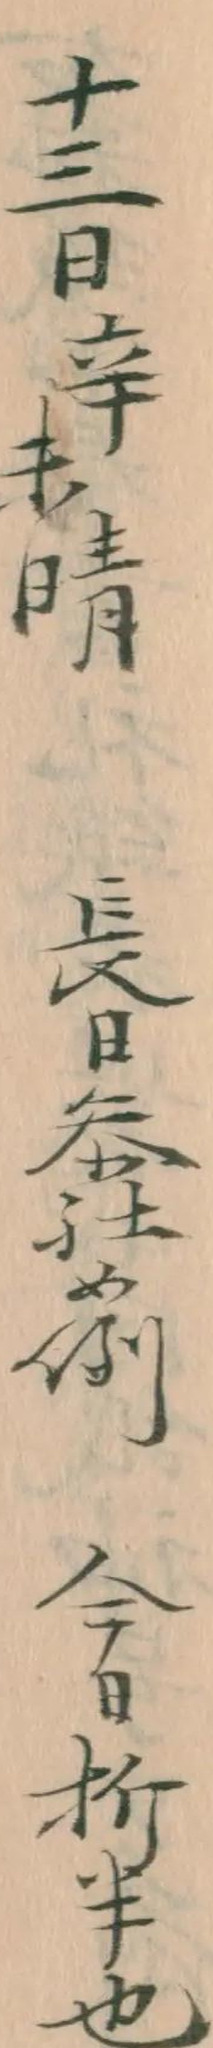十三日辛未晴長日参社如例今日折半也
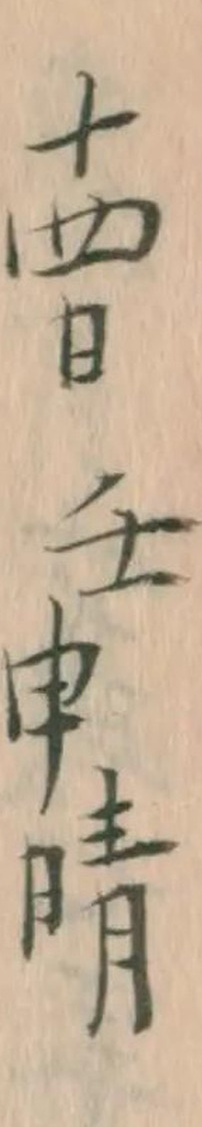十四日壬申晴
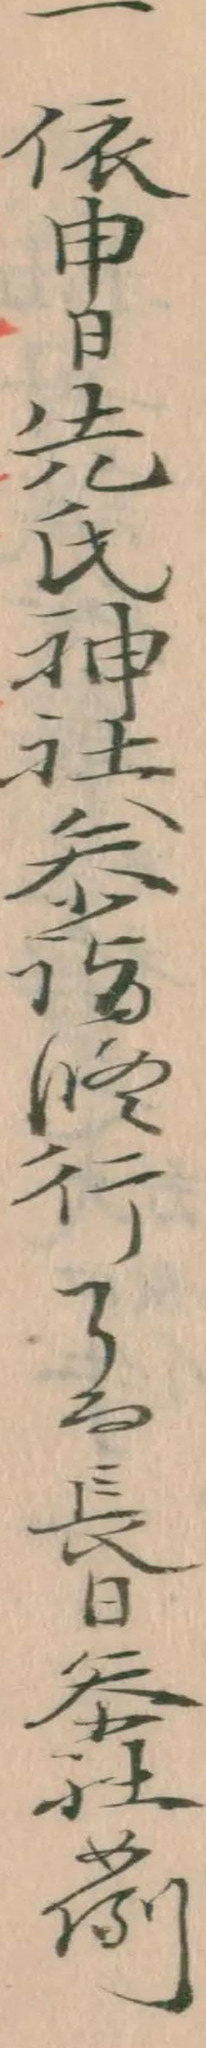一依申日先氏神社へ参詣修行了而長日参社如例
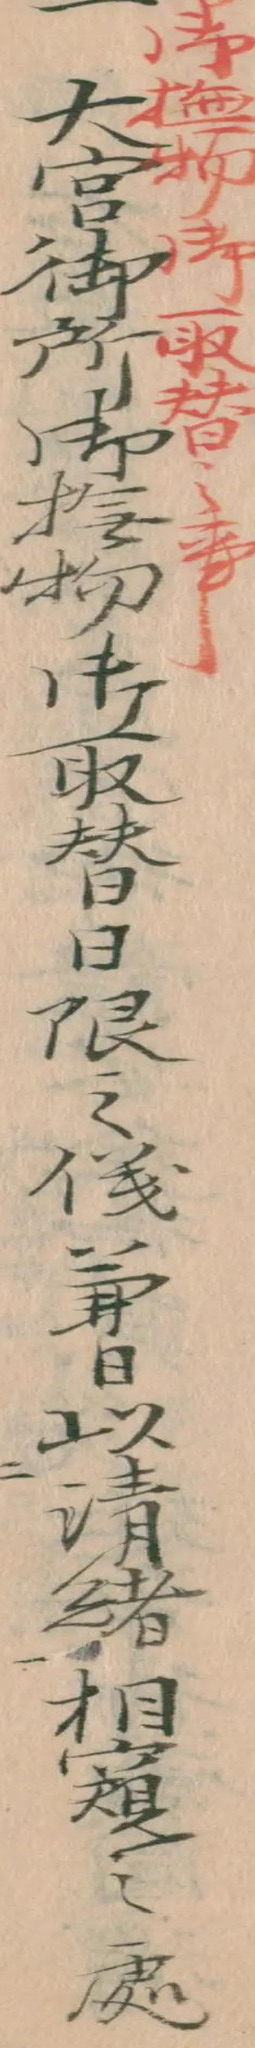一大宮御所御撫物御取替日限之儀兼日以清緒相窺之處
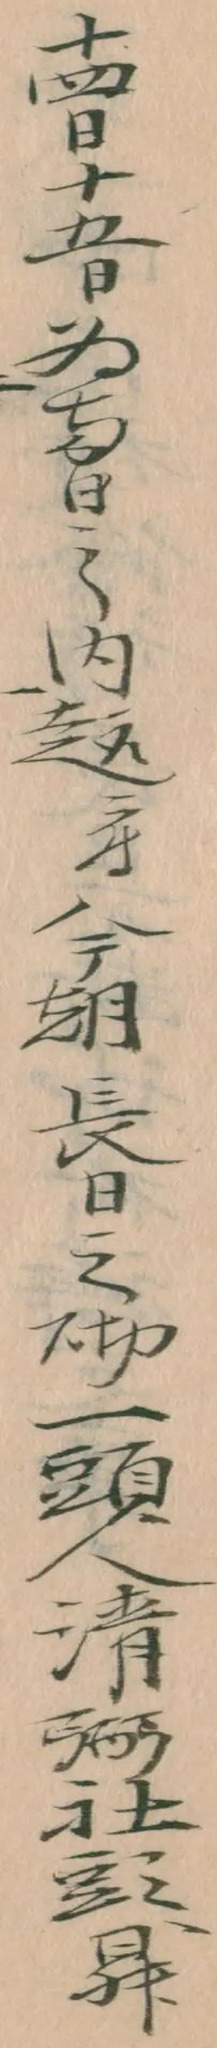十四日十五日為両日之内趣ニ付今朝長日之砌一頭人清弼社頭昇
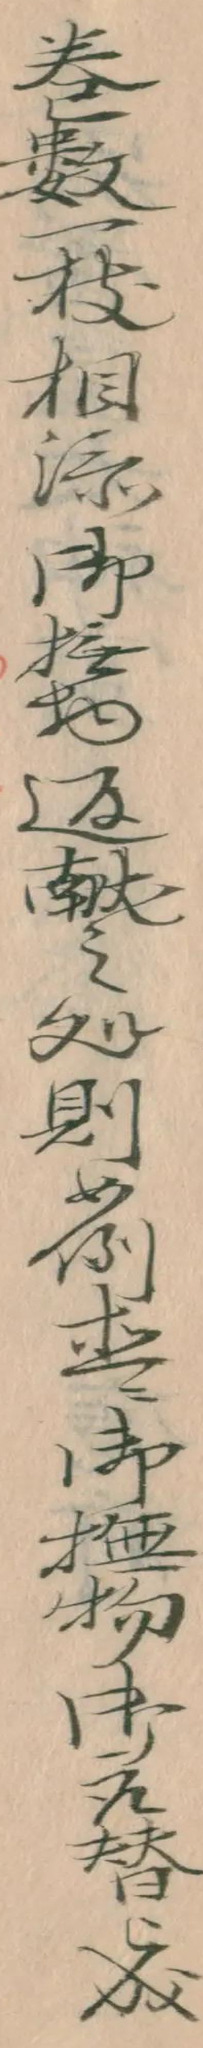巻数一枝相添御撫物返献之処則如例直ニ御撫物御取替被成
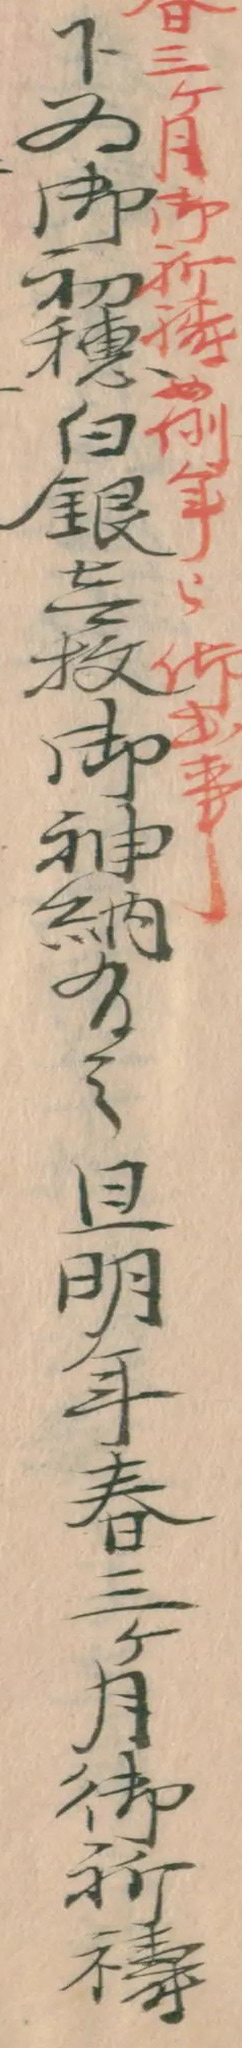下為御初穂白銀壱枚御神納有之且明年春三ケ月御祈祷
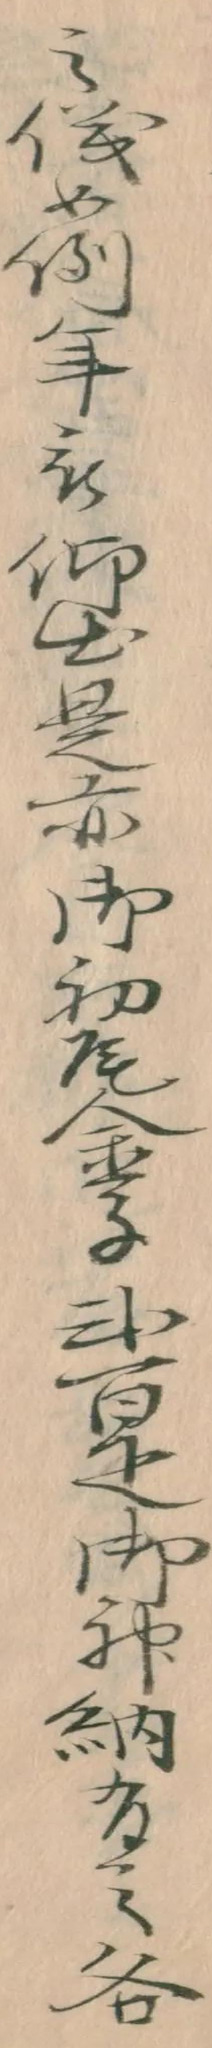之儀如例年被仰出是亦御初尾金子弐百疋御神納有之各

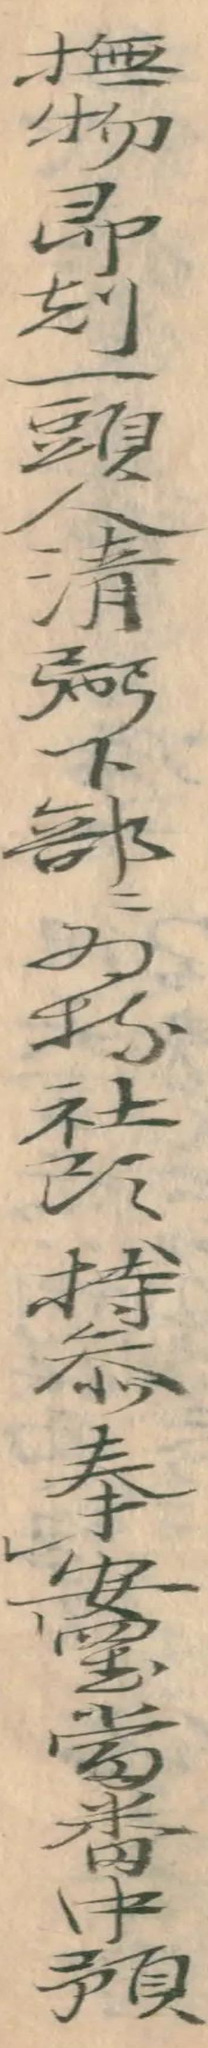撫物即刻一頭人清弼下部ニ為持社頭ヘ持参奉安置當番中預
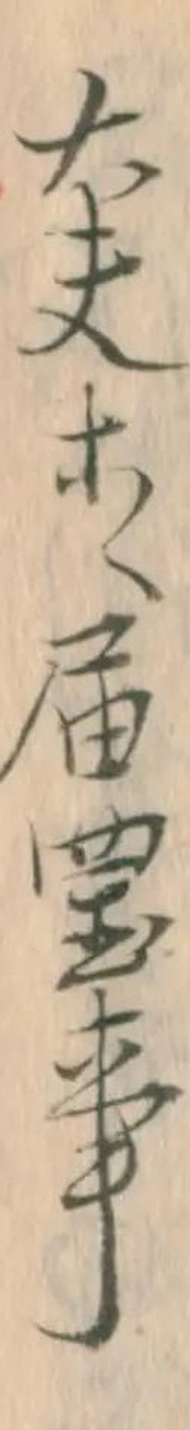大夫等へ届置事
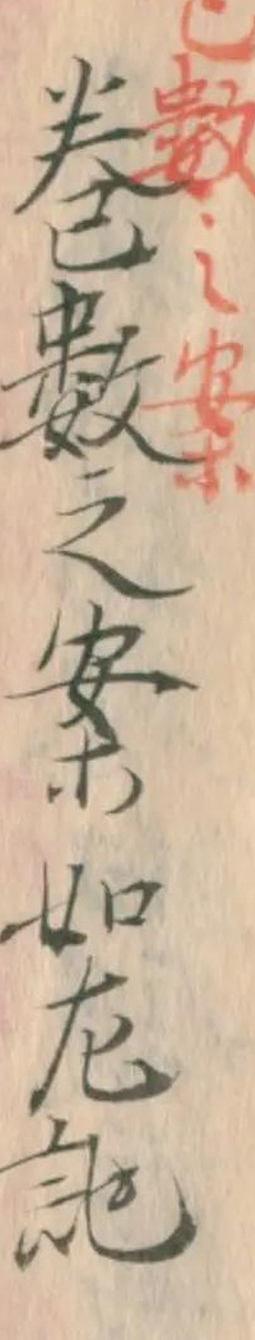巻数之案如左記
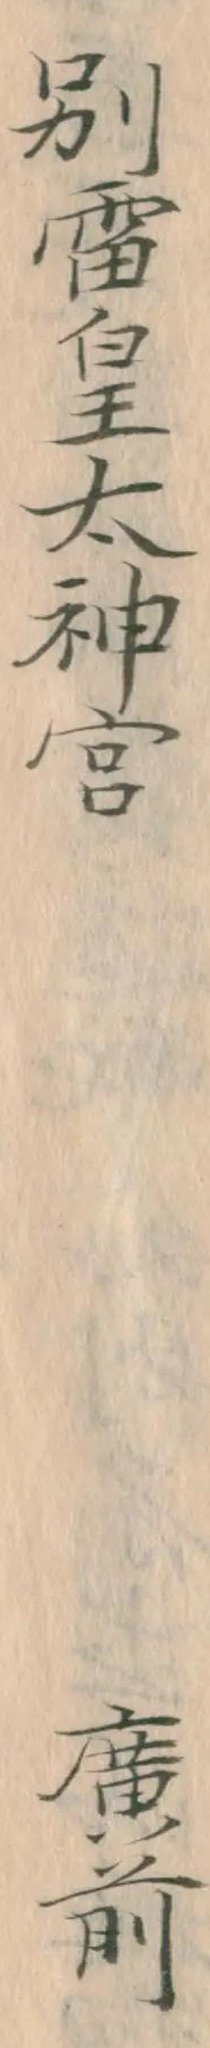別雷皇太神宮廣前
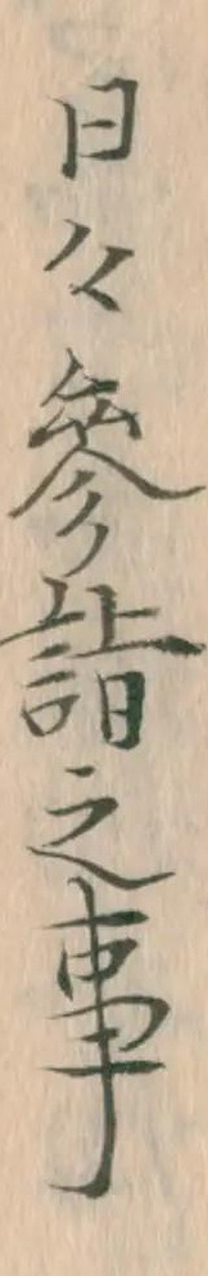日々参詣之事
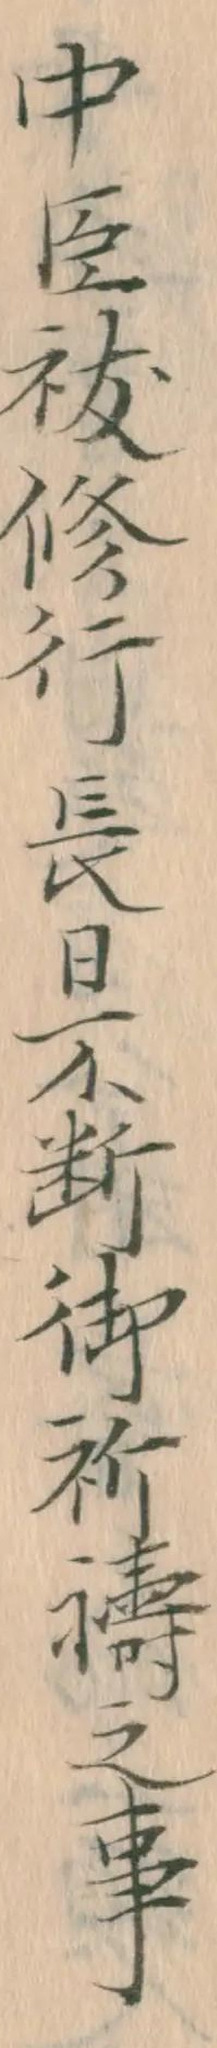中臣祓修行長日不断御祈祷之事
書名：賀茂社記録. 第74冊
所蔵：国立国会図書館 National Diet Library, JAPAN
